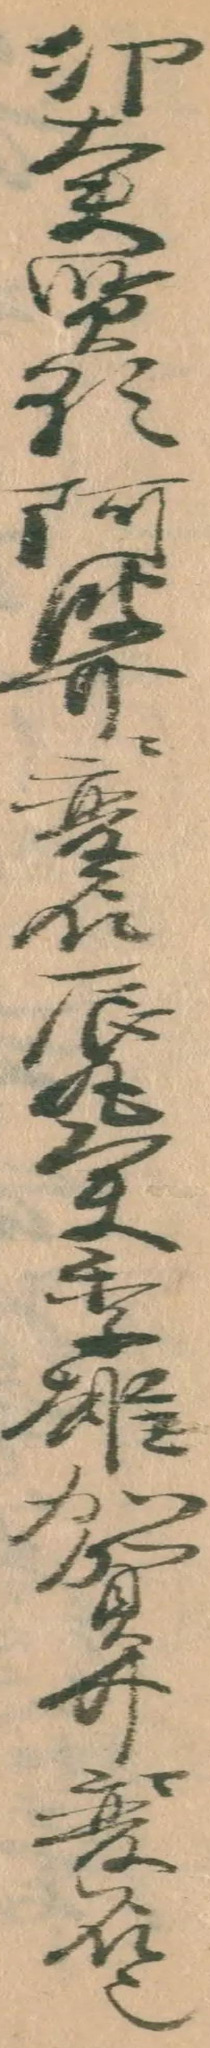卯大夫賢顕阿波介ニ変名辰丸大夫季雄加賀介ニ変名也
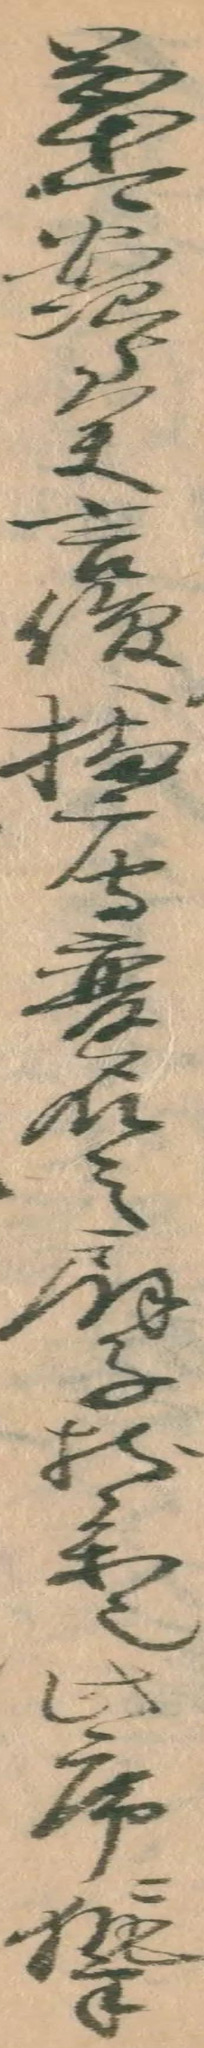岡本郷安次郎大夫言俊へ播磨守変名之扇子持参也此序ニ執筆
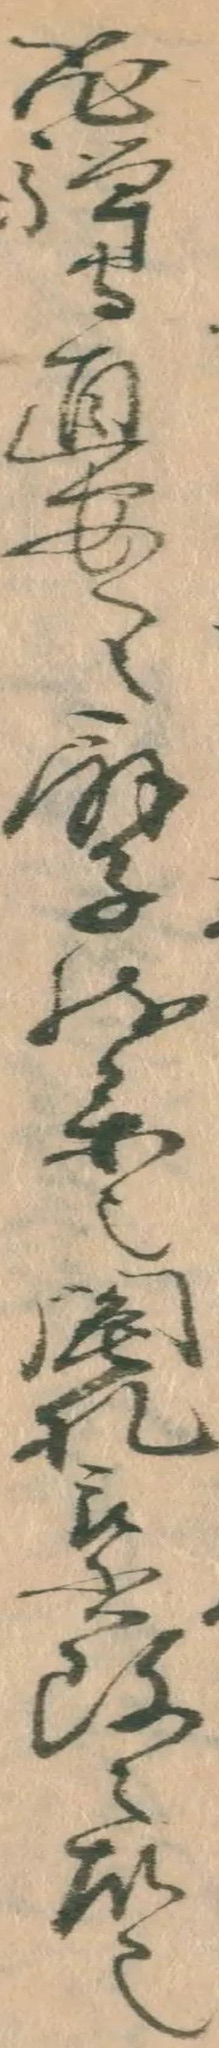飛騨守直安へも扇子持参也鬮札被書改之故也
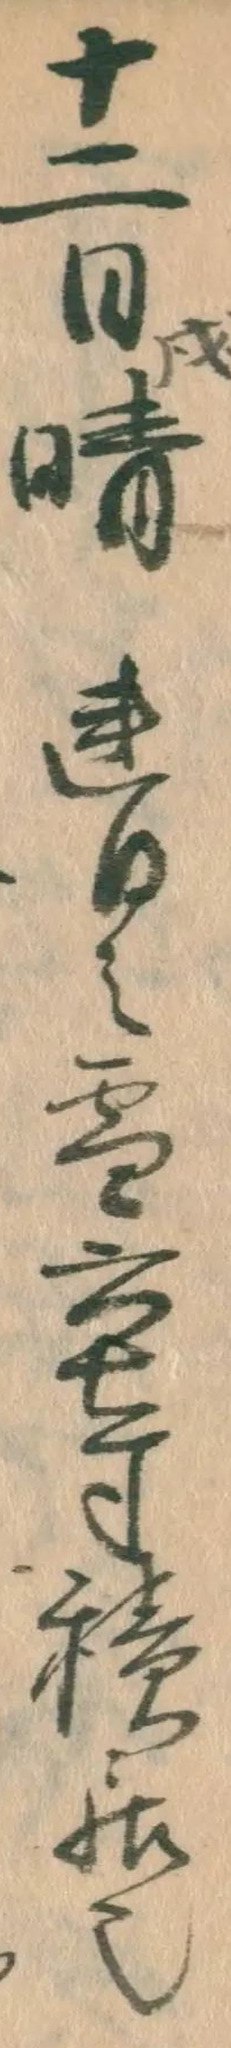十二日戌晴連日之雪六七寸積居也
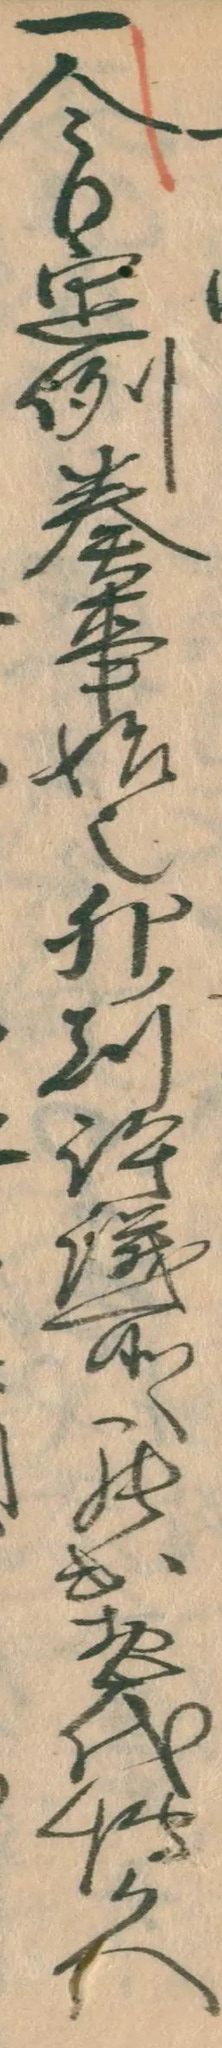一今日定例奏事始也卯ノ刻評議所へ罷出惣代博久
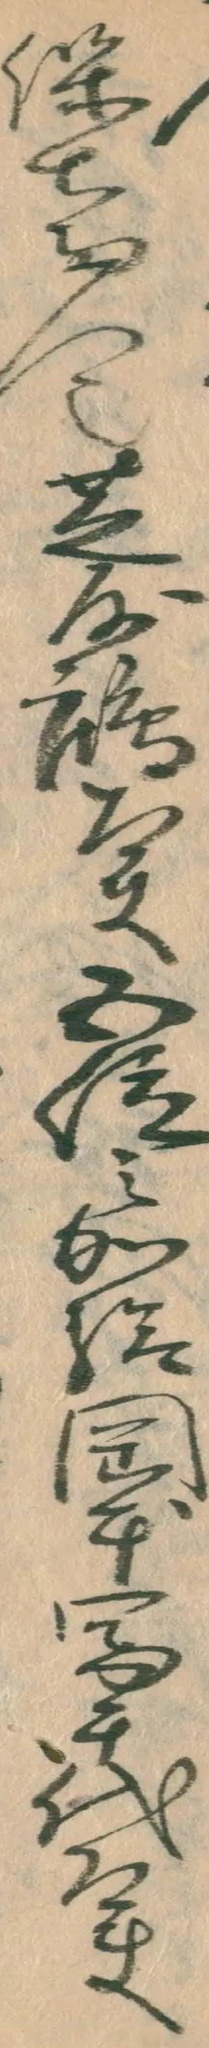保七土両人也芝屋鶴大夫五位之加給岡本富千代太夫
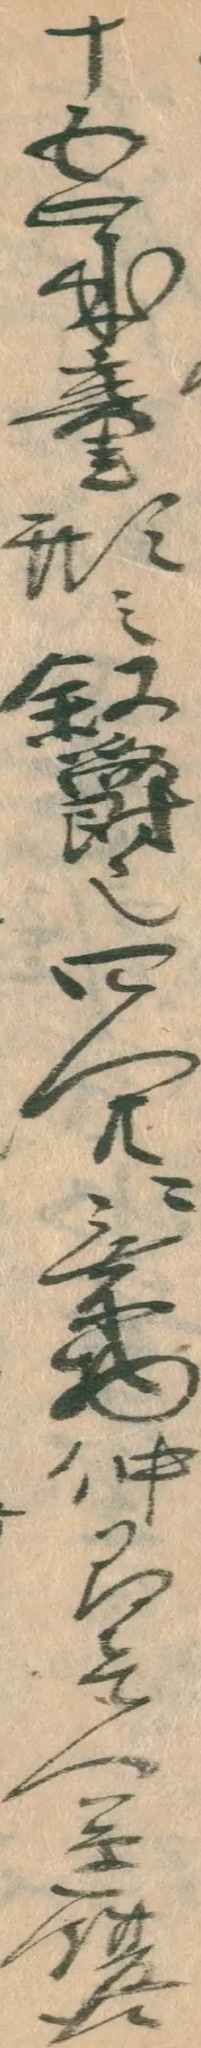十五歳童形之叙爵也四人共ニ乗物仲間壱人草履取
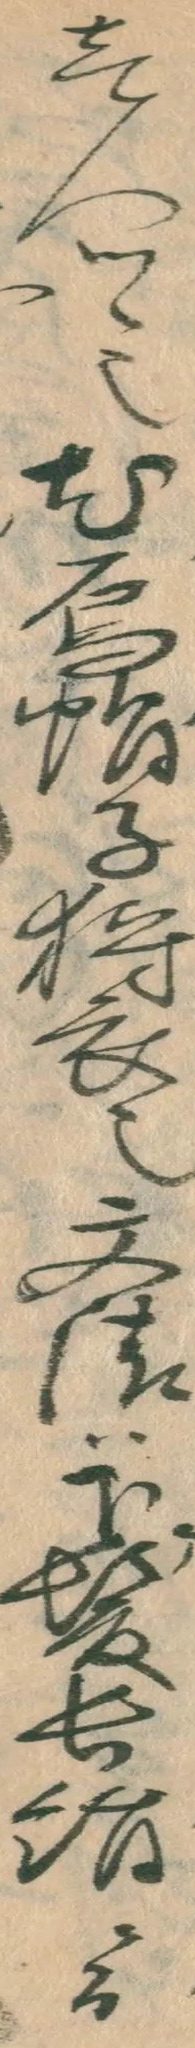壱人ツヽ也尤烏帽子狩衣也文清ハ下ケ髪長絹ニ而
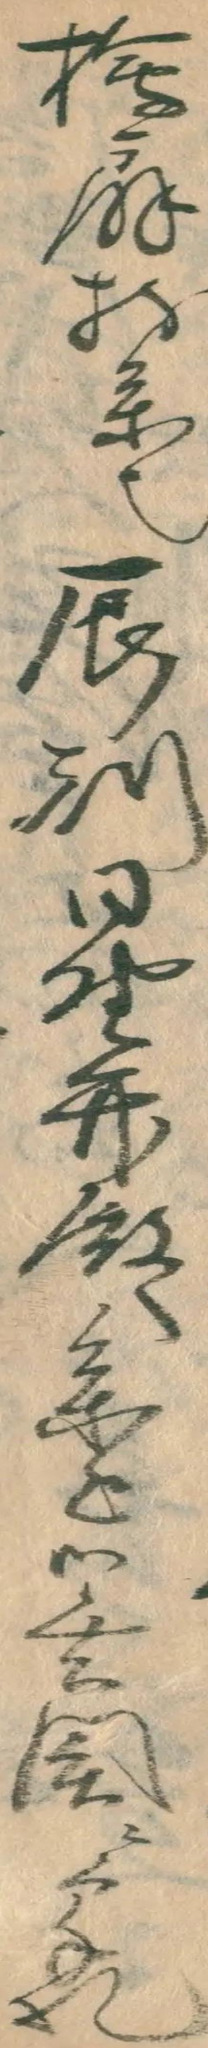檜扇持参也辰ノ刻日野弁殿へ参上御玄関ニ而手札
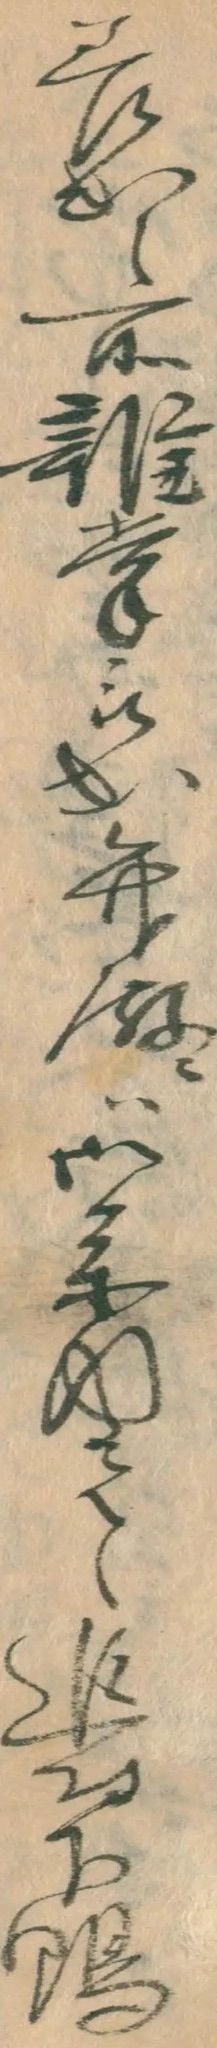差出候所雑掌被出弁殿ニハ御参内ニて追而下鴨

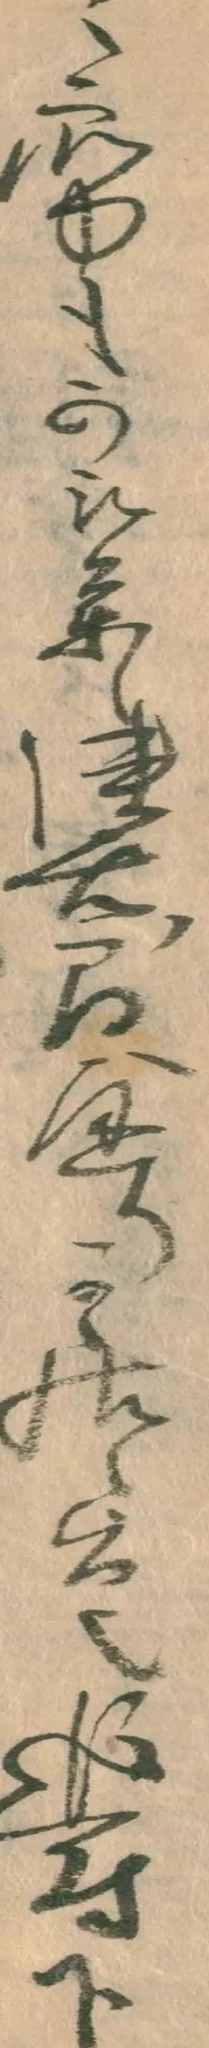之衆中も可被参候使者ノ間へ通り可居候旨也追付下
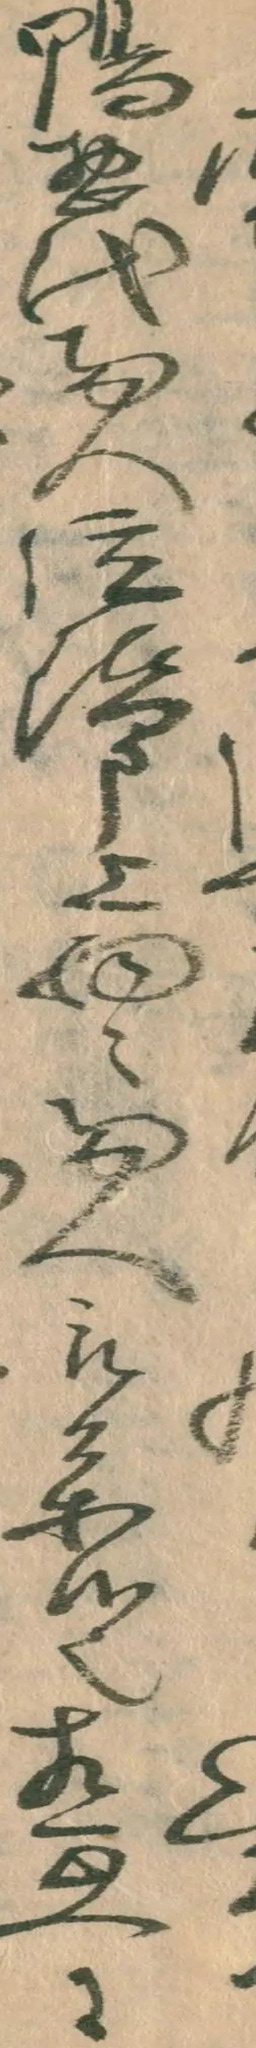鴨惣代両人位階申上面々被参候也相互に
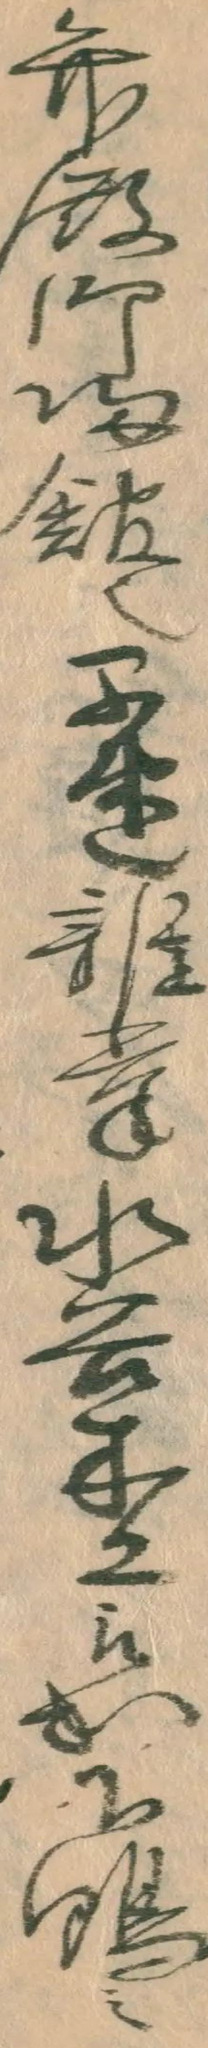弁殿御帰館也早速雑掌水谷木工被出下鴨之
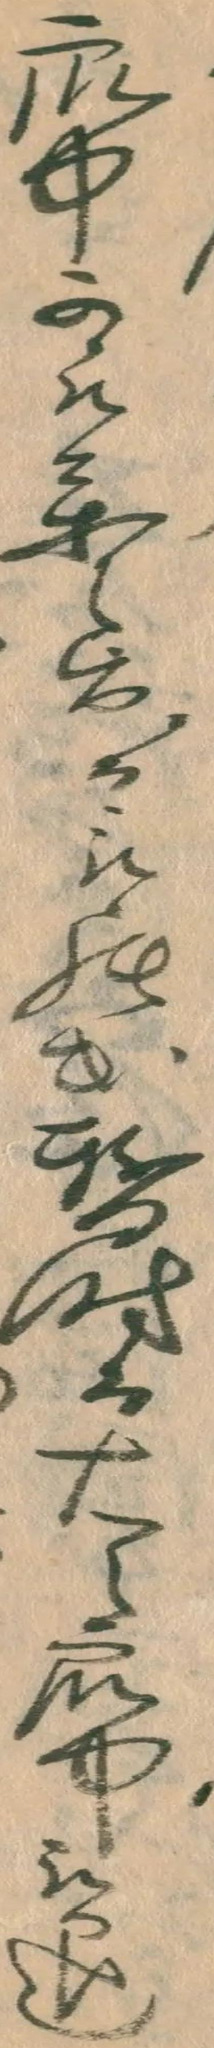衆中可被参之旨ニ而被罷出暫時而右之衆中被退
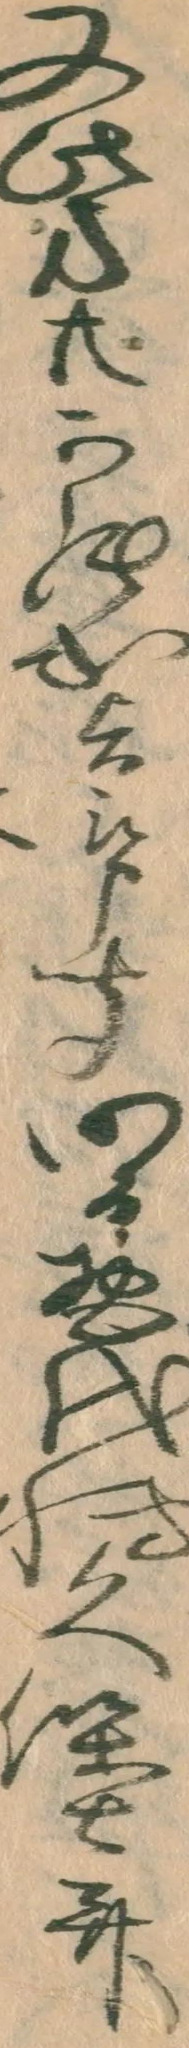又此方共可罷出旨被申聞仍而惣代博久保土并
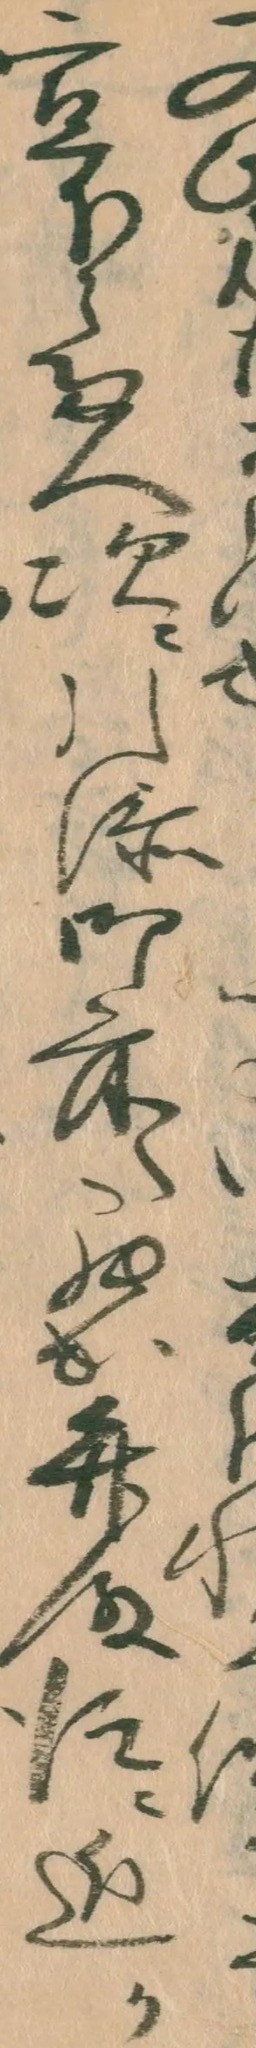宜下之両人次ニ引添御前へ罷出弁殿仰ニ近ク
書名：賀茂社記録. 第60冊
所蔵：国立国会図書館 National Diet Library, JAPAN
